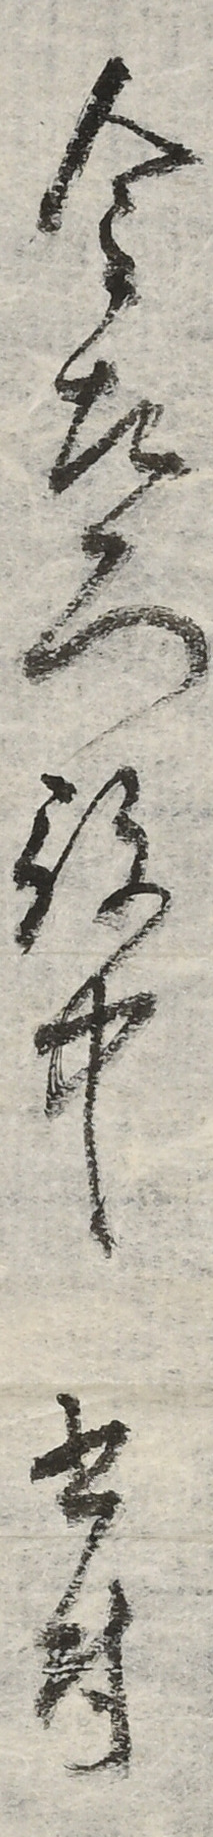金左衛門役中書付
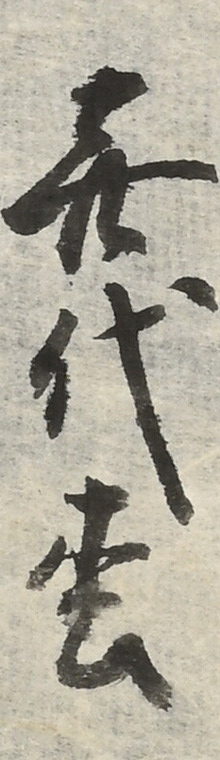喜代松

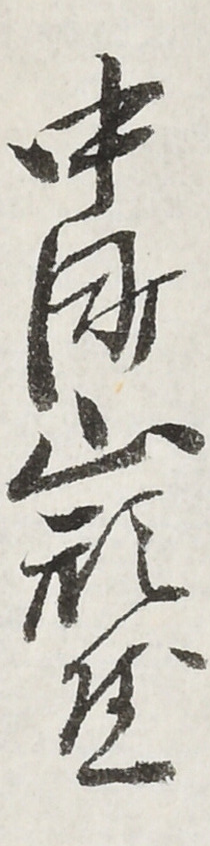中町山形屋
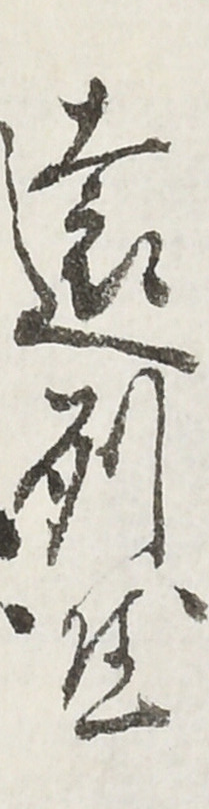遠州屋
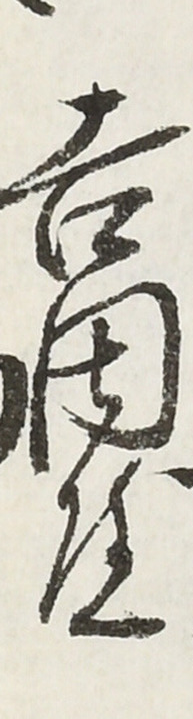吉田屋
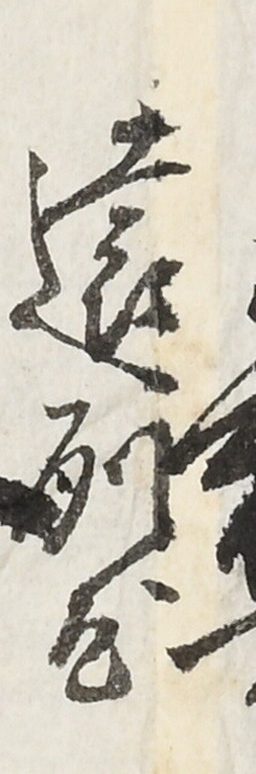遠州屋
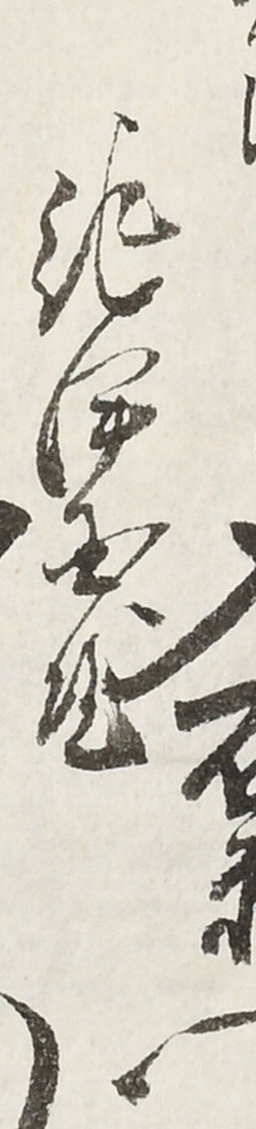紀伊国屋
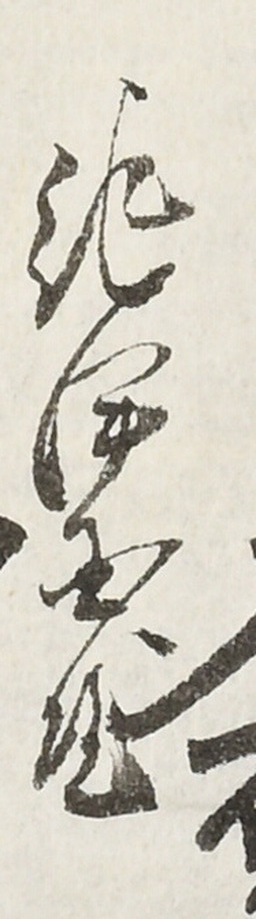紀伊国屋
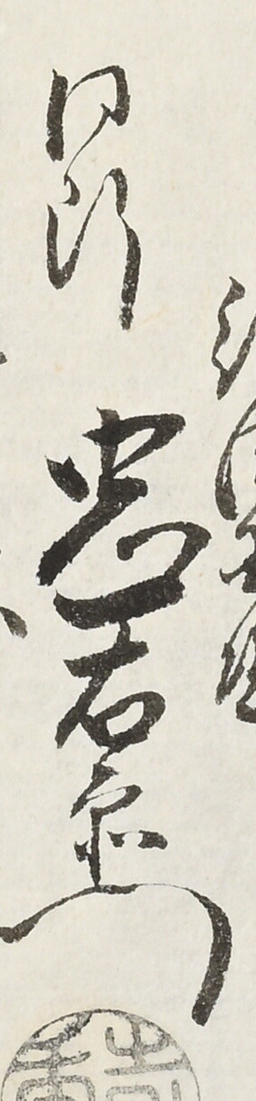同断忠右衛門㊞
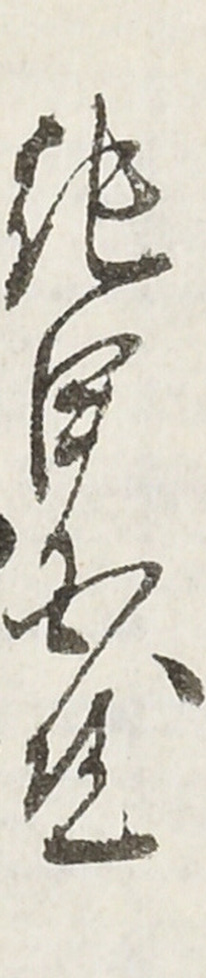紀伊国屋
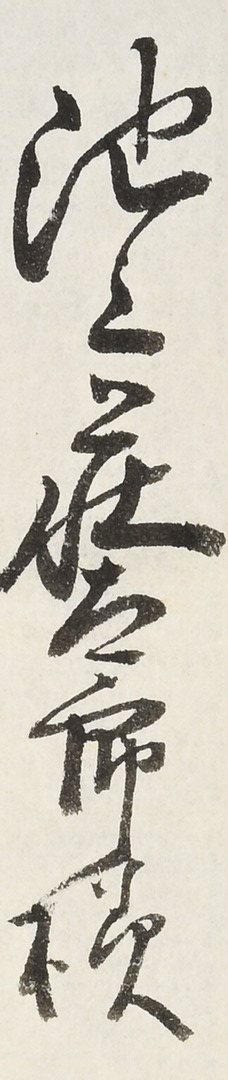池上荘太郎様
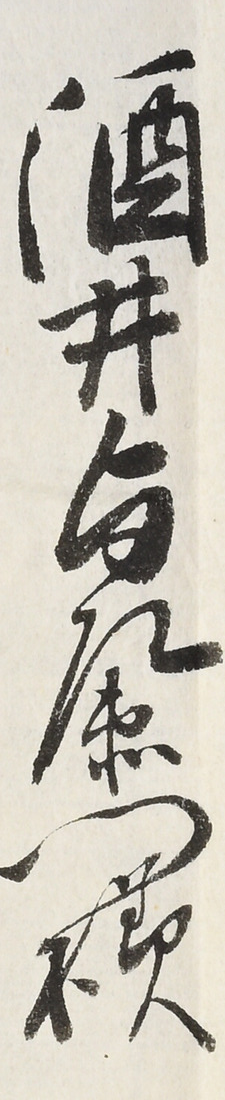酒井与左衛門様
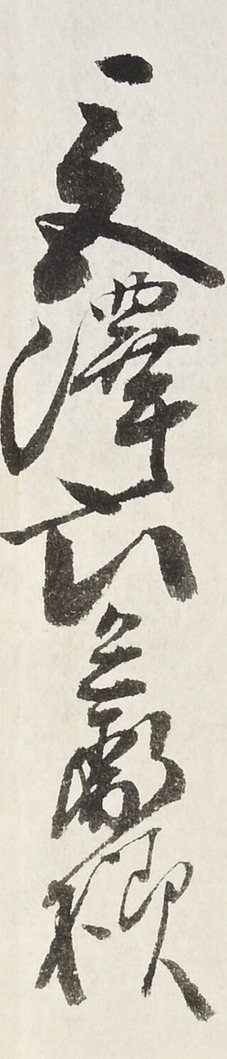宮澤六兵衛様
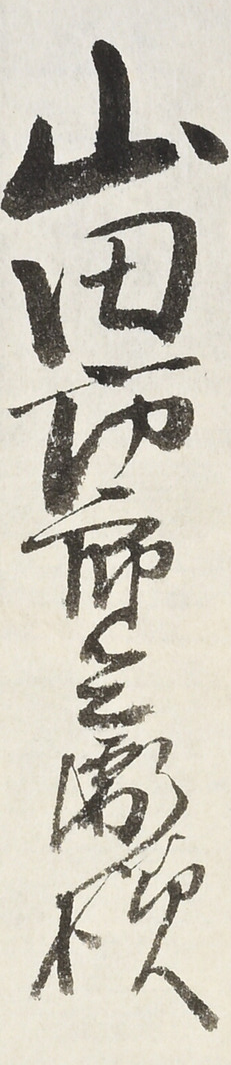山田市郎兵衛様
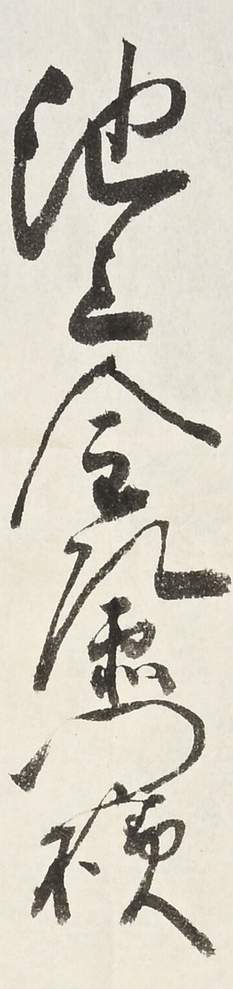池上金左衛門様
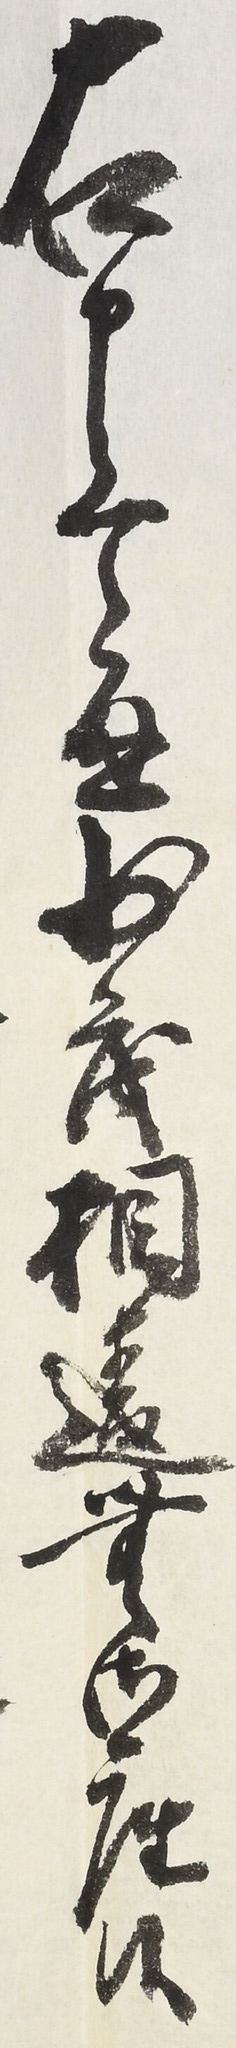右申上候通少茂相違無御座候
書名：差上申一札之事
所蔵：伊那市立高遠町図書館・合同会社AMANE
